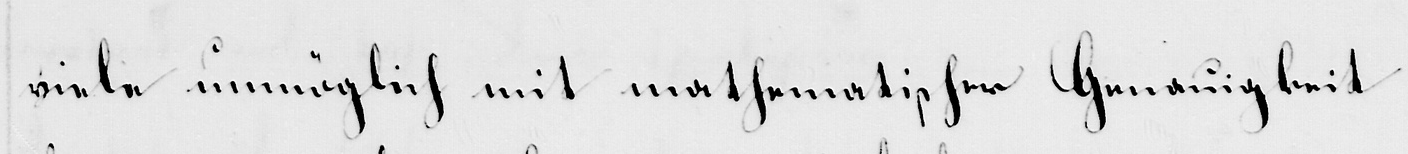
viele unmöglich mit mathematischer Genauigkeit
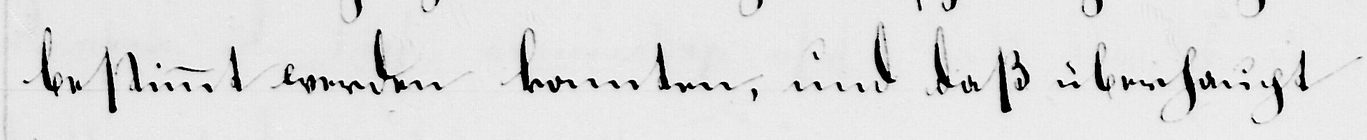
bestimmt werden konnten, und daß überhaupt
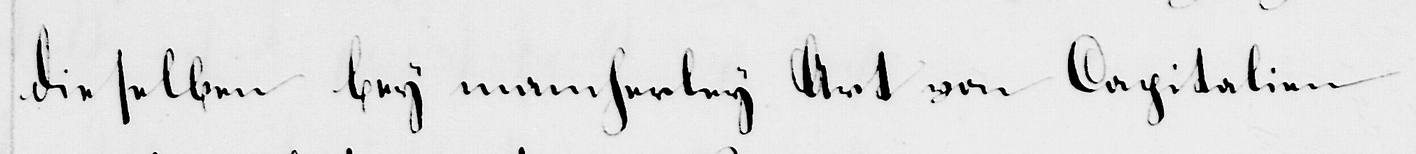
dieselben bey mancherley Art von Capitalien
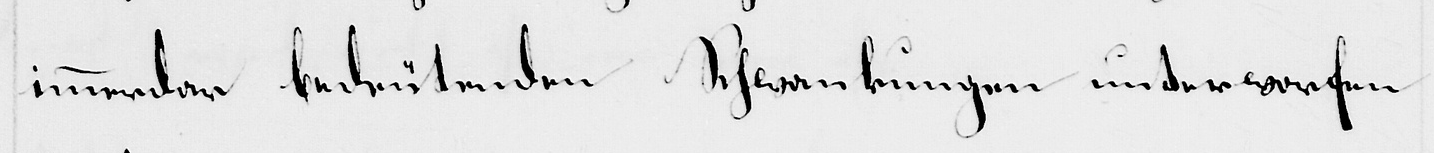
immerdar bedeutenden Schwankungen unterworfen
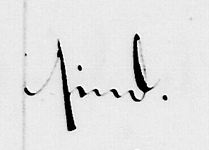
sind.
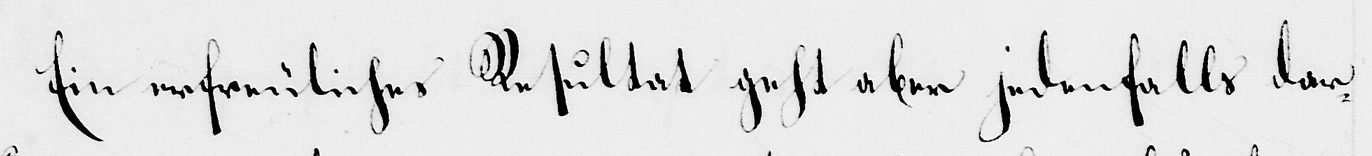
Ein erfreuliches Resultat geht aber jedenfalls dar¬
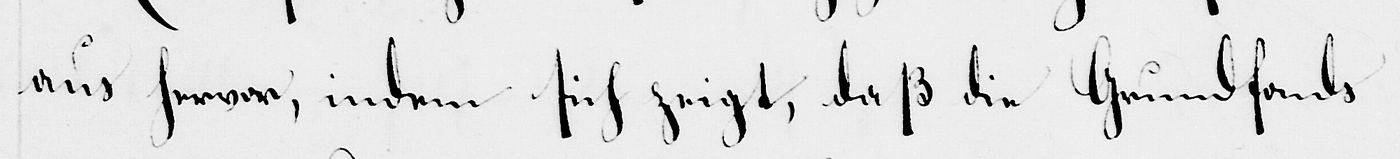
aus hervor, indem sich zeigt, daß die Grundfonds
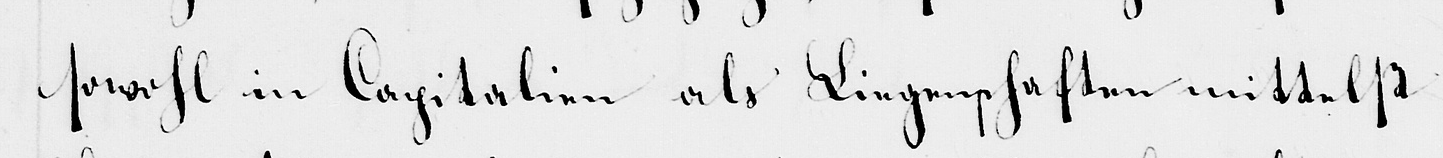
sowohl in Capitalien als Liegenschaften mittelst
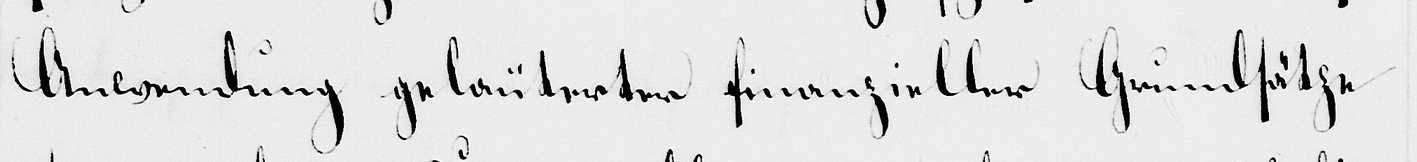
Anwendung geläuterter finanzieller Grundsätze
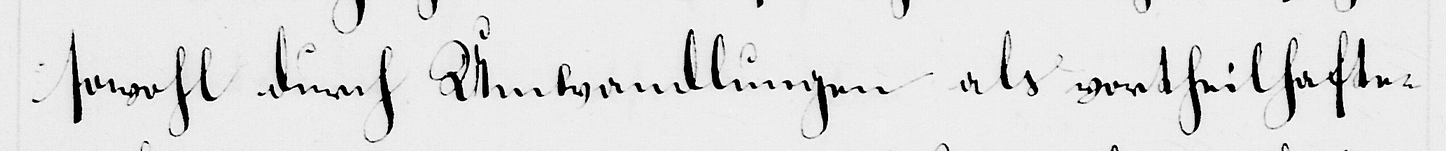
sowohl durch Umwandlungen als vortheilhafte¬
